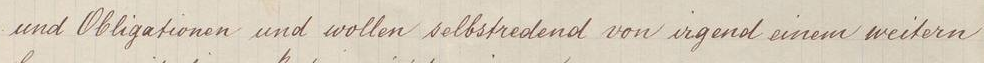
und Obligationen und wollen selbstredend von irgend einem weitern
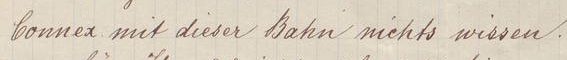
Connex. mit dieser Bahn nichts wissen.
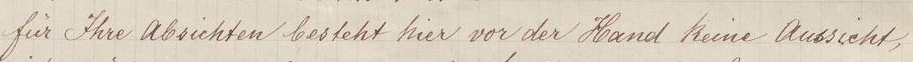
Für Ihre Absichten besteht hier vor der Hand keine Aussicht,
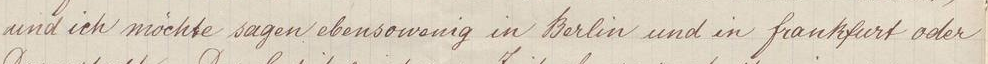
und ich möchte sagen ebensowenig in Berlin und in Frankfurt oder
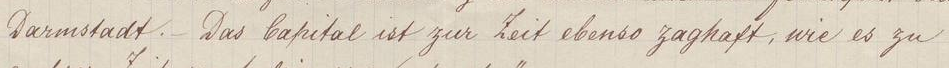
Darmstadt. – Das Capital ist zur Zeit ebenso zaghaft, wie es zu
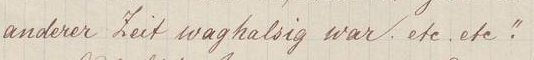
anderer Zeit waghalsig war. etc. etc.»
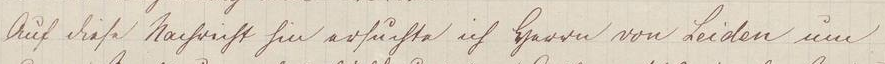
Auf diese Nachricht hin ersuchte ich Herrn von Leiden um
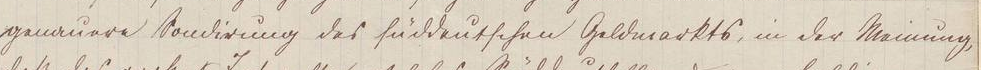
genauere Sondirung des süddeutschen Geldmarkts, in der Meinung,
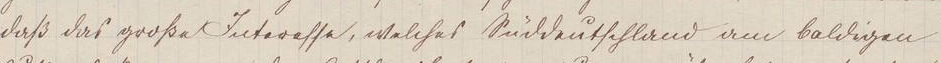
daß das große Interesse, welches Süddeutschland am baldigen
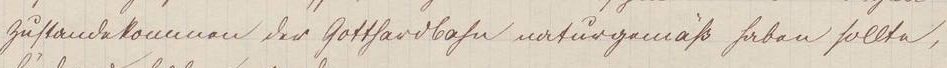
Zustandekommen der Gotthardbahn naturgemäß haben sollte,
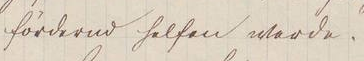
fördernd helfen werde.
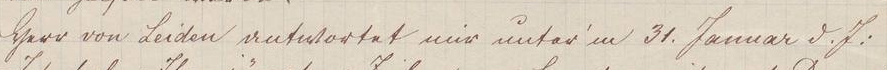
Herr von Leiden antwortet mir unter'm 31. Januar d. J :
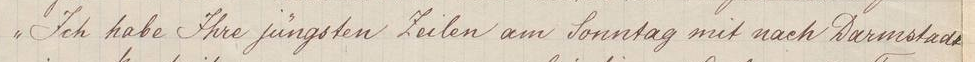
«Ich habe Ihre jüngsten Zeilen am Sonntag mit nach Darmstadt
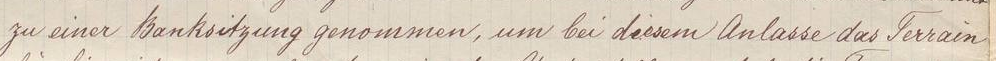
zu einer Banksitzung genommen, um bei diesem Anlasse das Terrain
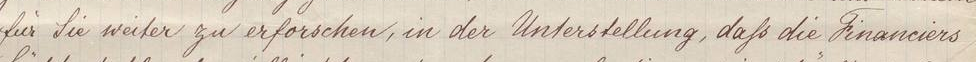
für Sie weiter zu erforschen, in der Unterstellung, daß die Financiers
